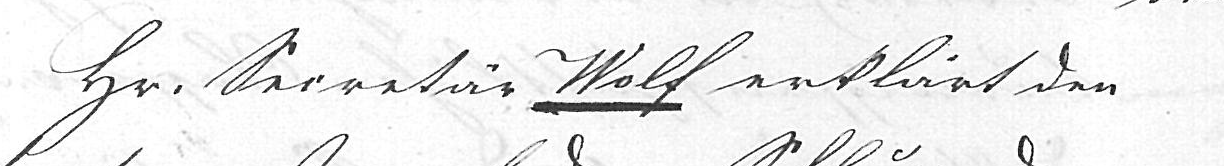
Hr. Secretär Wolf erklärt den
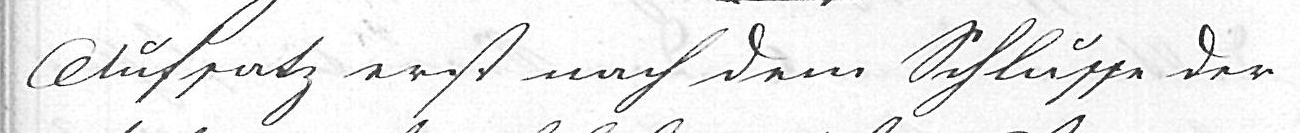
Aufsatz erst nach dem Schlusse der
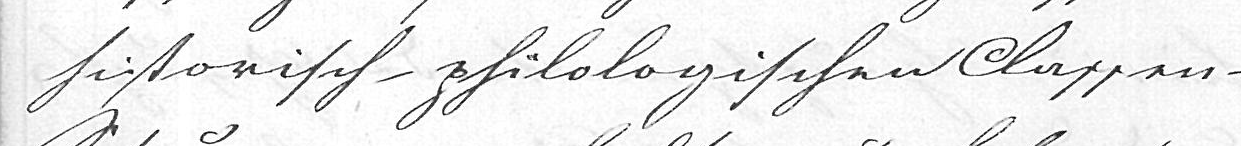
historisch-philologischen Classen-
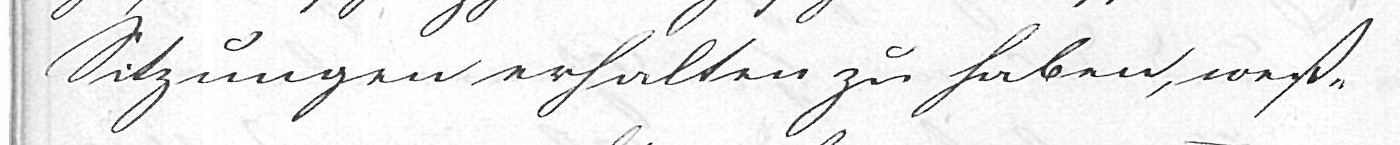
Sitzungen erhalten zu haben, weß-
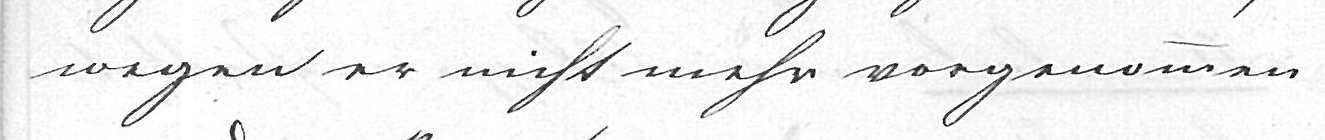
wegen er nicht mehr vorgenommen
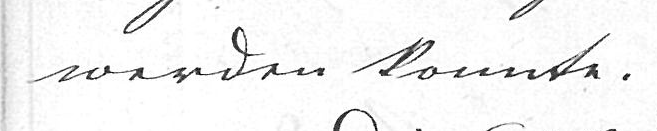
werden konnte.
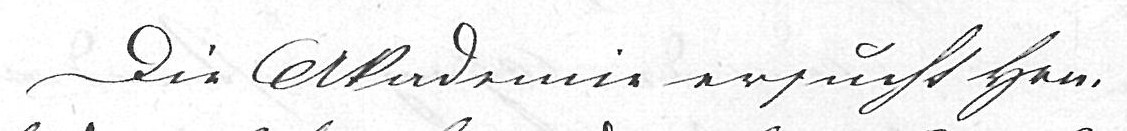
Die Akademie ersucht Hrn.
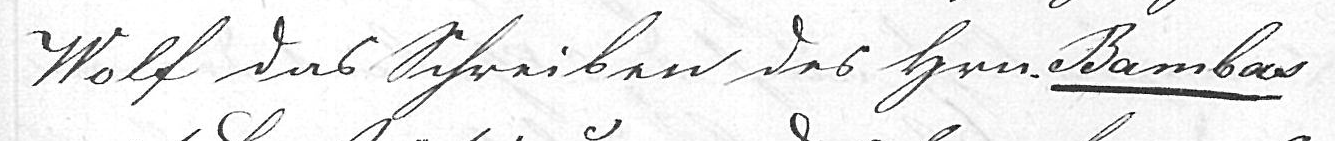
Wolf das Schreiben des Hrn. Bambas
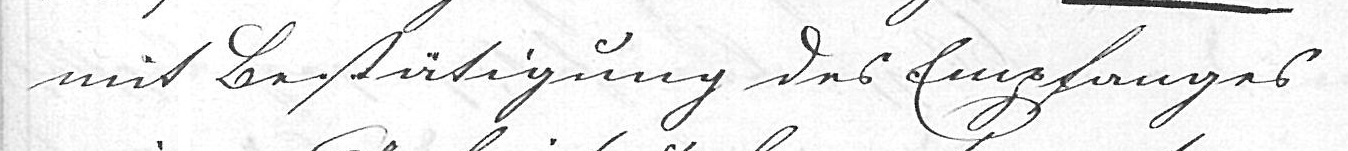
mit Bestätigung des Empfanges
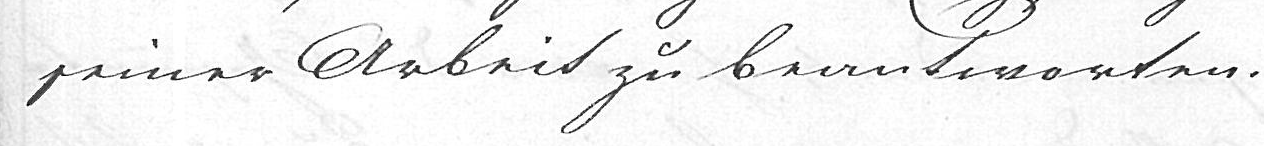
seiner Arbeit zu beantworten.
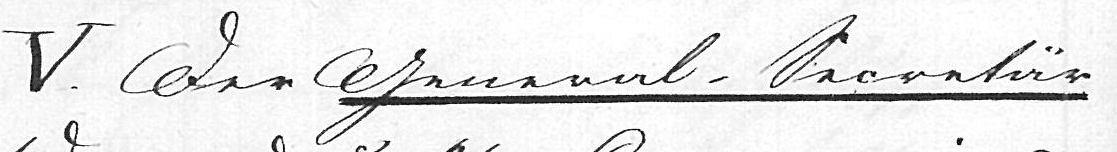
V. Der General-Secretär
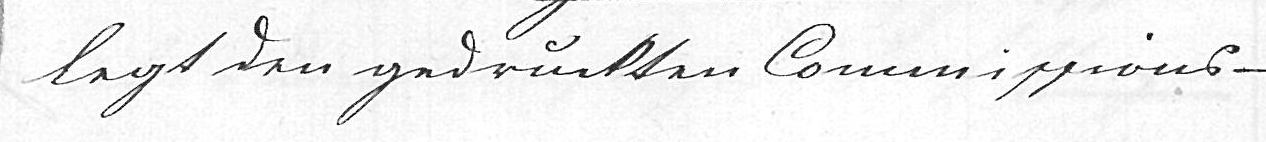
legt den gedruckten Commissions-
